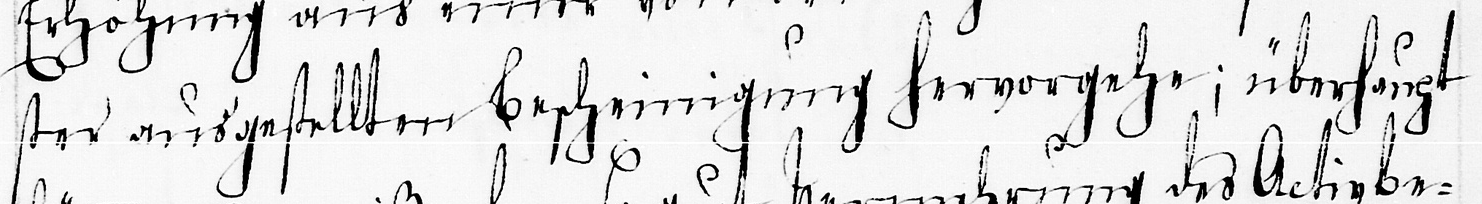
ster ausgestellten Bescheinigung hervorgehe; überhaupt
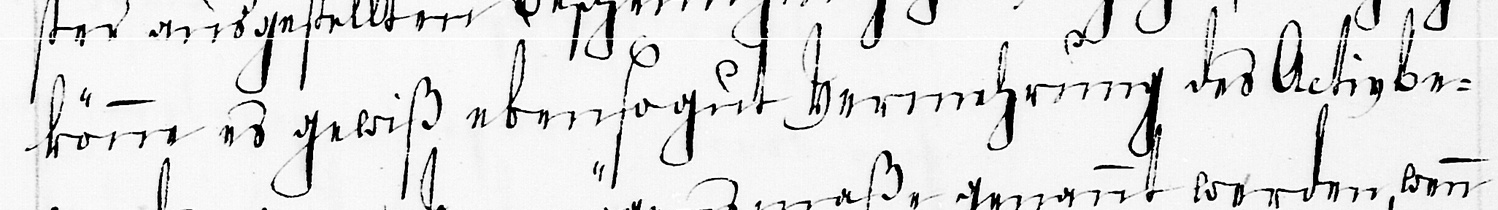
könne es gewiß ebensogut Vermehrung des Activbe¬
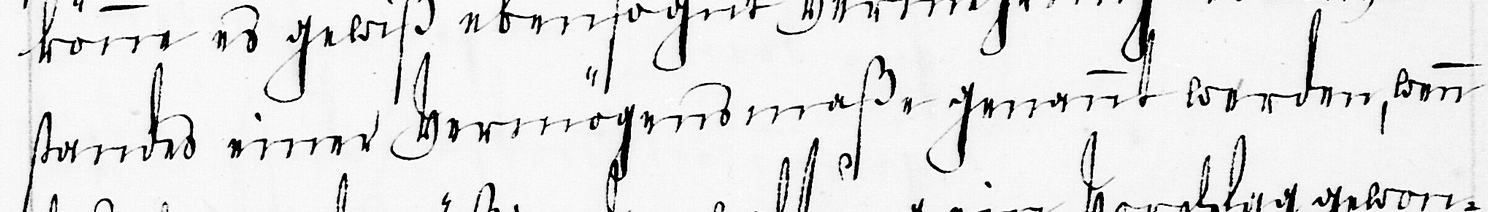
standes einer Vermögensmaße genannt werden, wenn
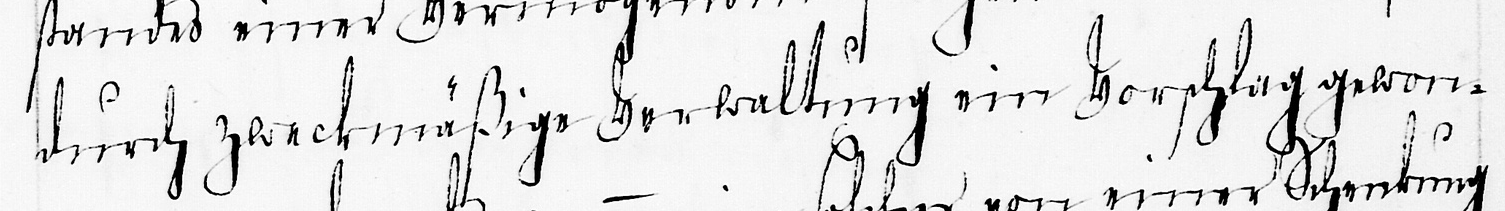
durch zweckmäßige Verwaltung ein Vorschlag gewon¬
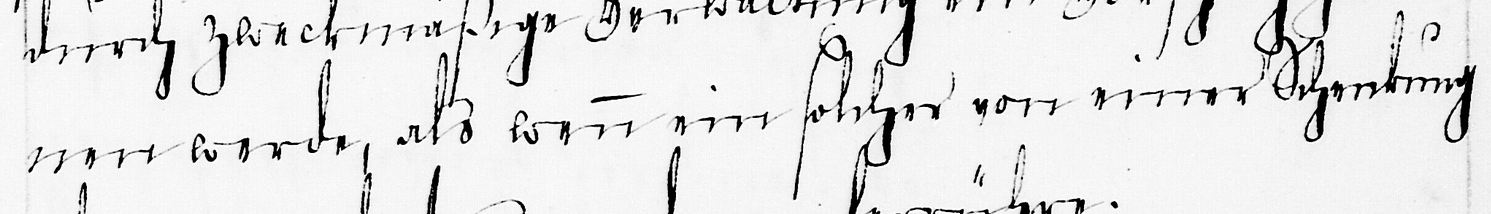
nen werde, als wenn ein solcher von einer Schenkung
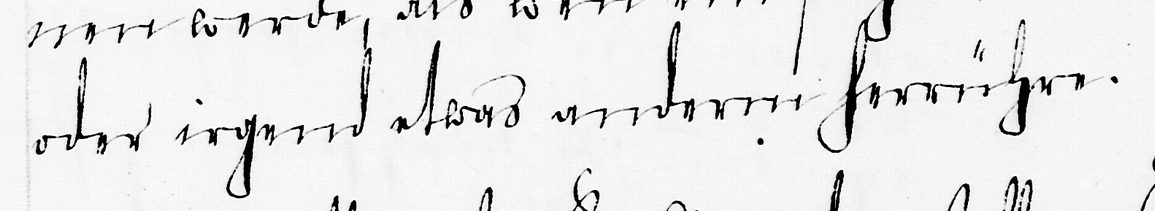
oder irgend etwas anderm herrühre.
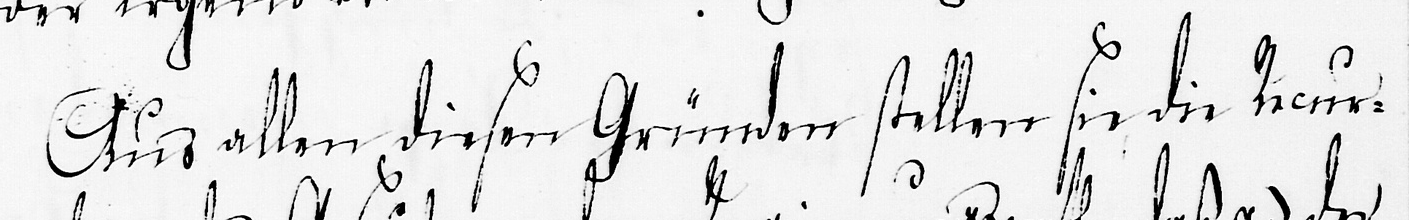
Aus allen diesen Gründen stellen sie, die Recu¬
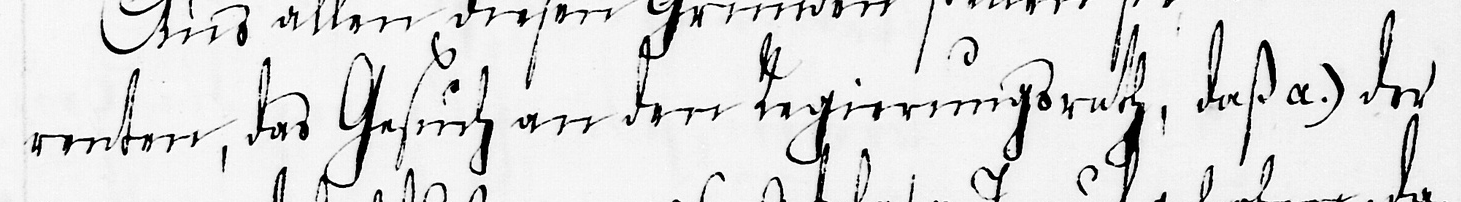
renten, das Gesuch an den Regierungsrath, daß a.) der
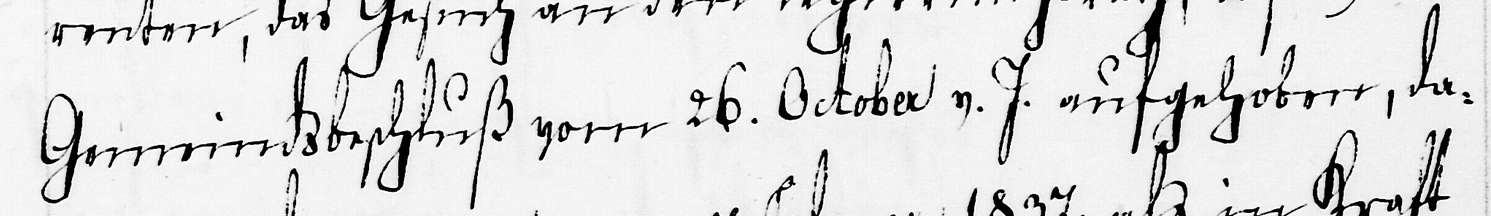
Gemeindsbeschluß vom 26. October v. J. aufgehoben, da¬
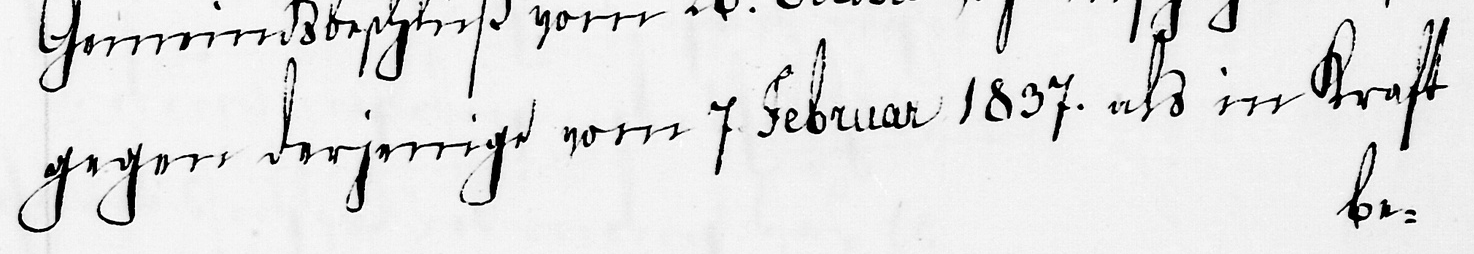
gegen derjenige vom 7. Februar 1837. als in Kraft
